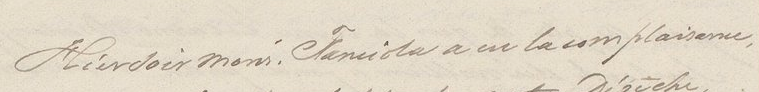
Hier soir Mons. Fanciola a eu la complaisance,
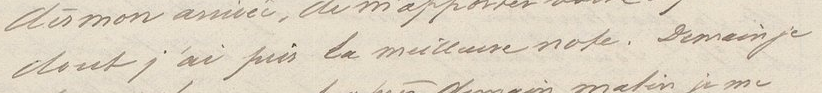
dont j'ai pris la meilleure note. Demain je
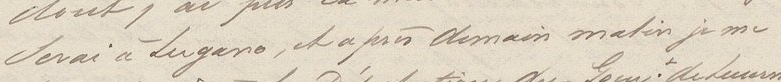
serai à Lugano, et après demain matin je me
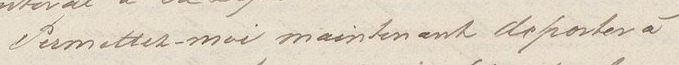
Permettez-moi maintenant de porter à
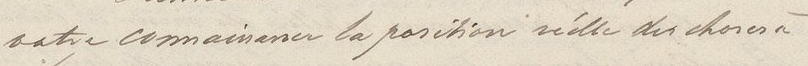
votre connaissance la position réelle des choses
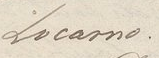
Locarno.
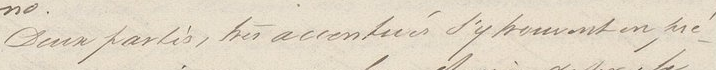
Deux partis, très accentués s'y trouvent en pré-
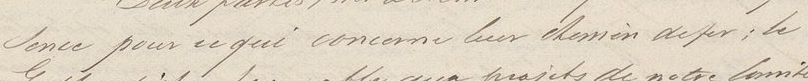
sence pour ce qui concerne leur chemin de fer; le
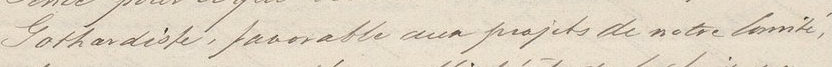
Gothardiste, favorable aux projets de notre Comité,
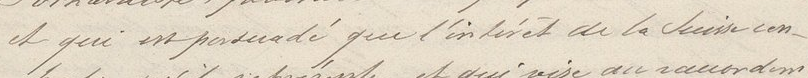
et qui est persuadé que l'intérêt de la Suisse cen-
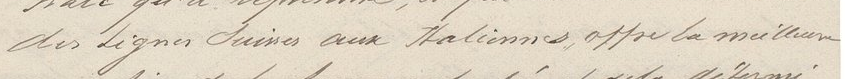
des lignes Suisses aux Italiennes, offre la meilleure
